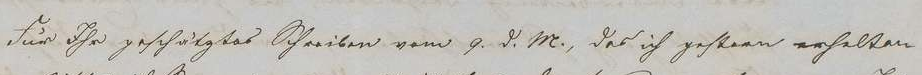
Für Ihr geschätztes Schreiben vom 9. d. M., das ich gestern erhalten
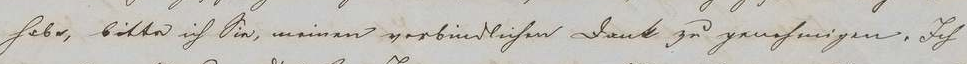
habe, bitte ich Sie, meinen verbindlichen Dank zu genehmigen. Ich
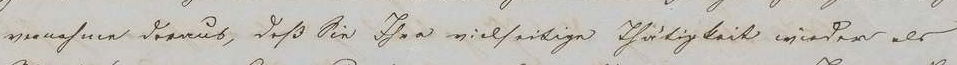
vernehme daraus, daß Sie Ihre vielseitige Thätigkeit wieder als
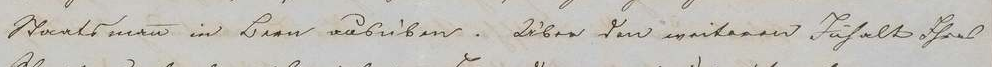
Staatsmann in Bern ausüben. Über den weiteren Inhalt Ihres
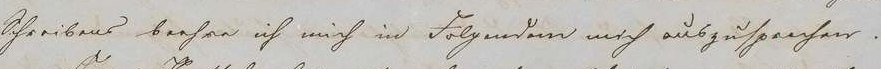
Schreibens beehre ich mich in Folgendem mich auszusprechen.
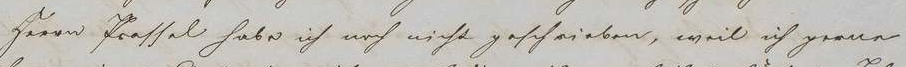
Herrn Pressel habe ich noch nicht geschrieben, weil ich gerne
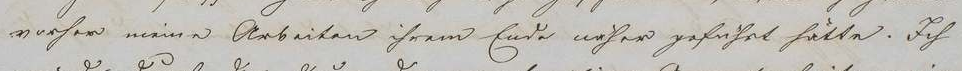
vorher meine Arbeiten ihrem Ende näher geführt hätte. Ich
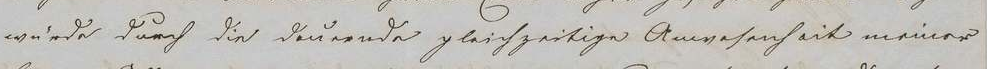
würde durch die dauernde gleichzeitige Anwesenheit meiner
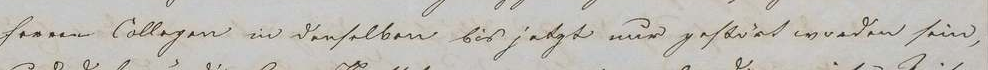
Herren Collegen in denselben bis jetzt nur gestört worden sein,
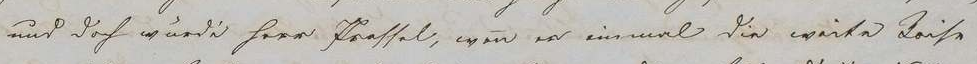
und doch würde Herr Pressel, wenn er einmal die weite Reise
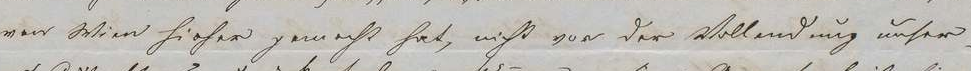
von Wien hieher gemacht hat, nicht vor der Vollendung unser-
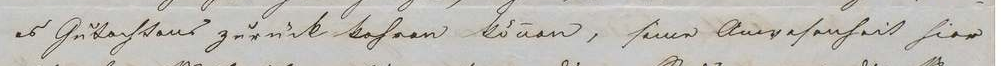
es Gutachtens zurück kehren können, seine Anwesenheit hier
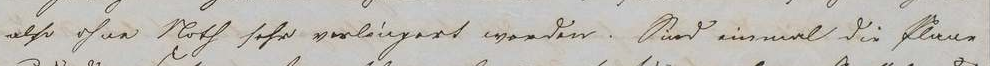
also ohne Noth sehr verlängert werden. Sind einmal die Plane
